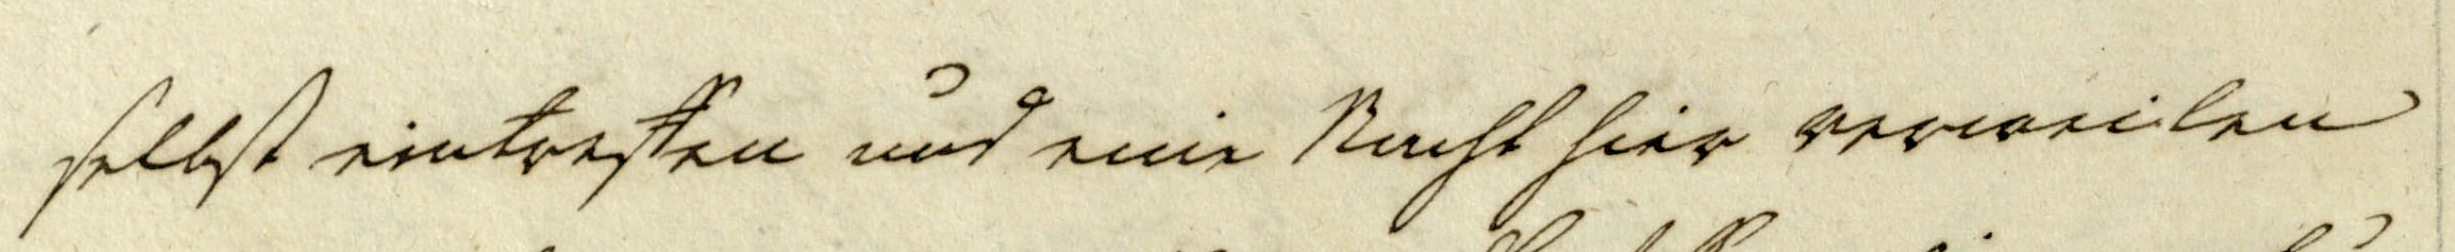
selbst eintreffen und eine nNcht hier verweilen
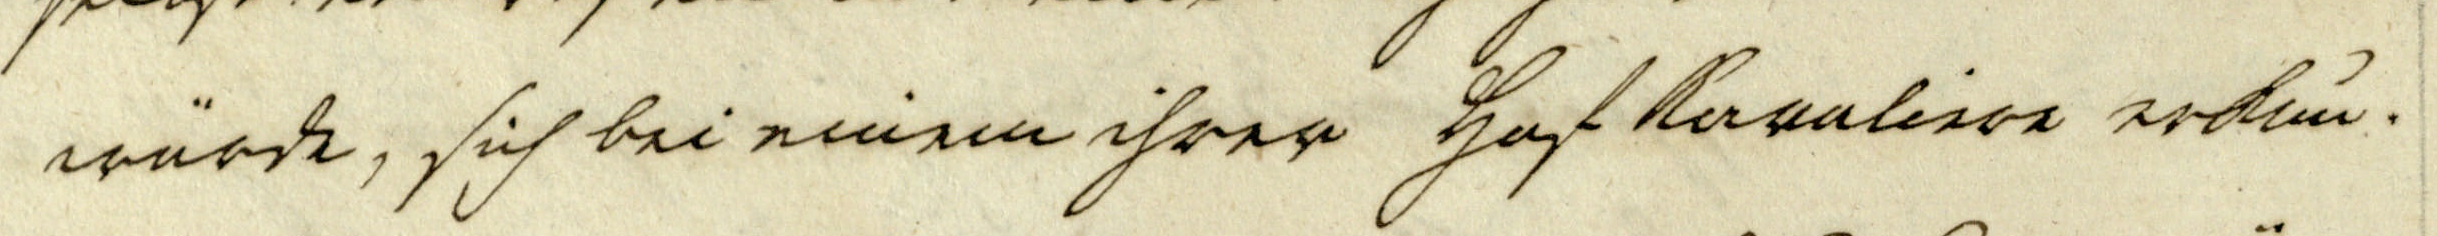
würde, sich bei einem ihrer Hof Kavaliere erkun¬
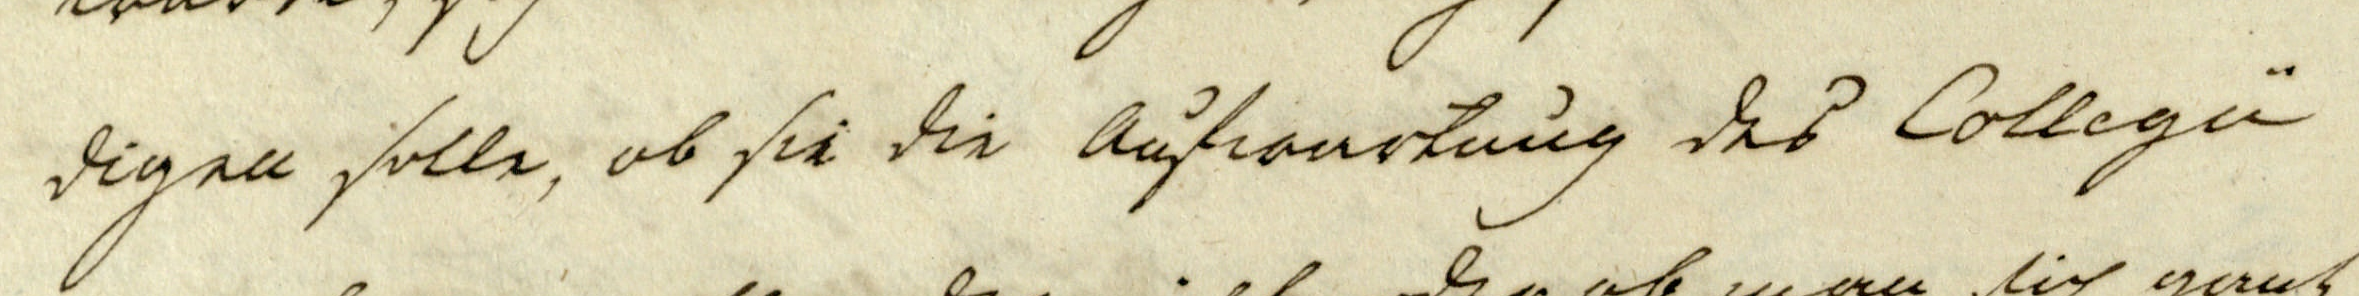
digen solle, ob sie die Aufwartung des Collegii
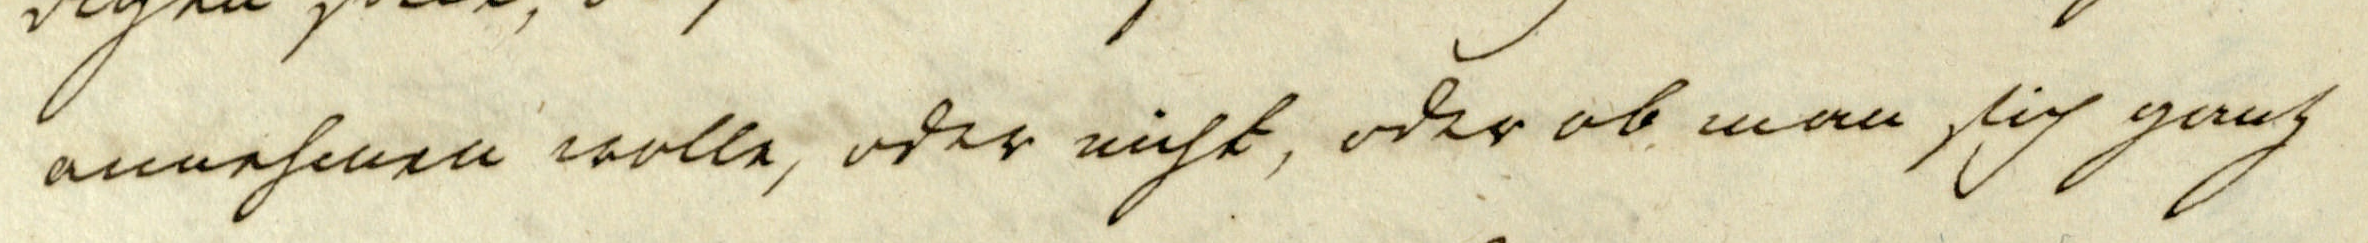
annehmen wolle, oder nicht, oder ob man sich ganz
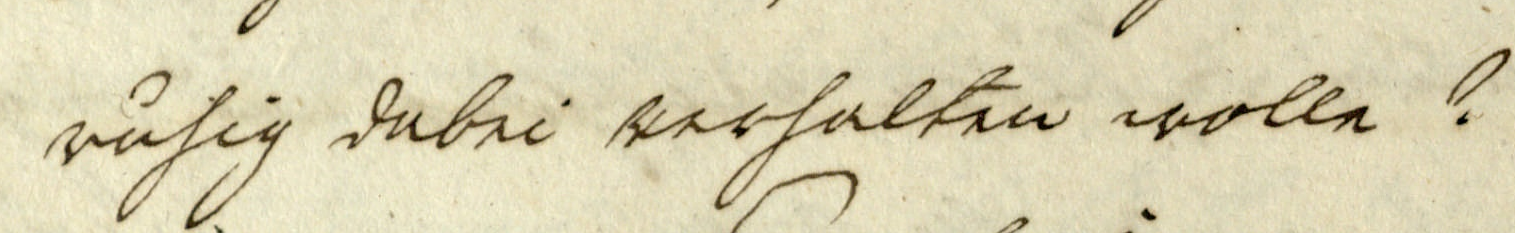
ruhig dabei verhalten wolle!
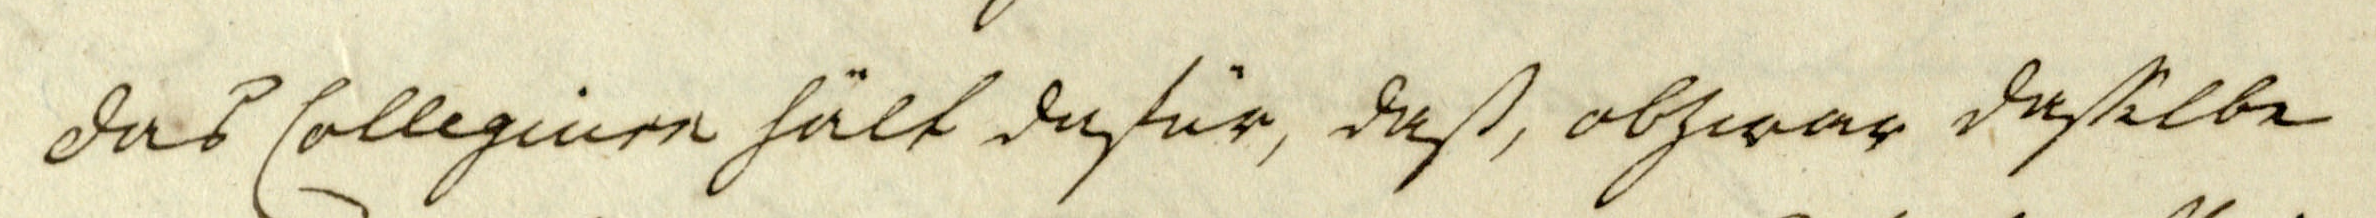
Das Collegium hält dafür, daß, obzwar dasselbe
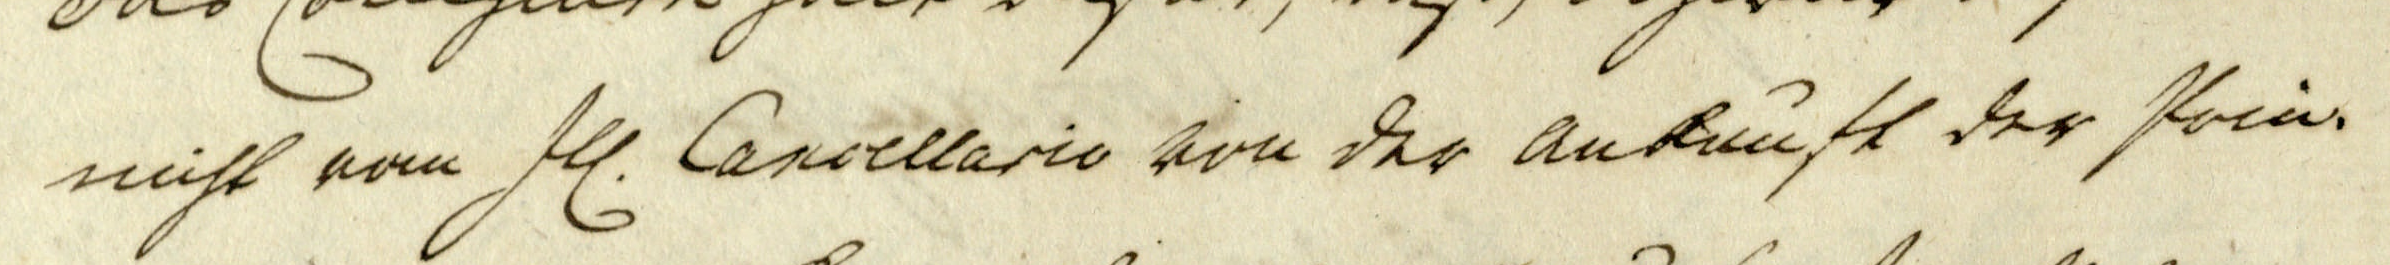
nicht vom Ill. Cancellario von der Ankunft der Prin¬
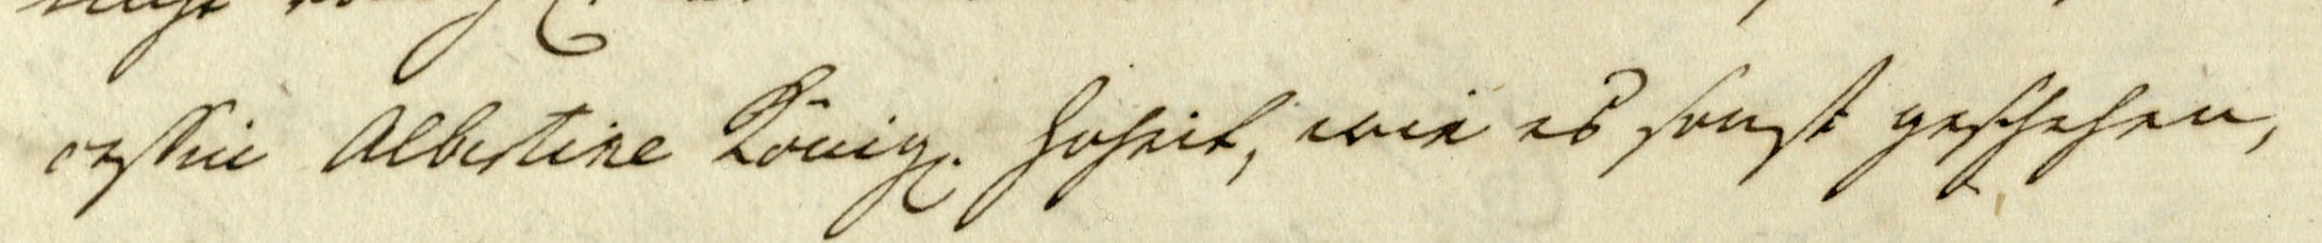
cessin Albertine Königl. Hoheit, wie es sonst geschehen,
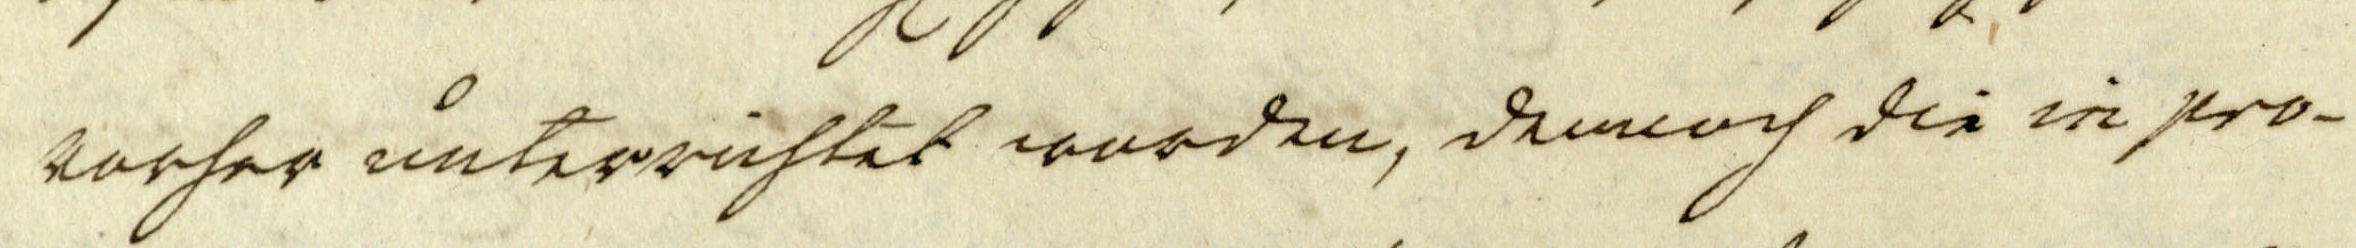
vorher unterrichtet worden, demnach die in pro¬
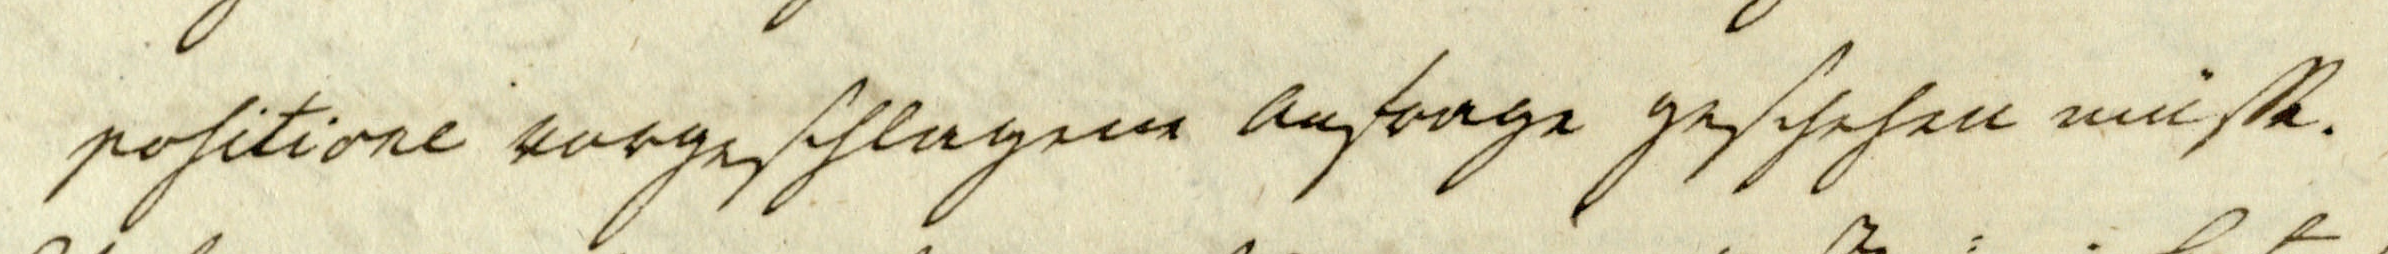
positione vorgeschlagene Anfrage geschehen müsse.
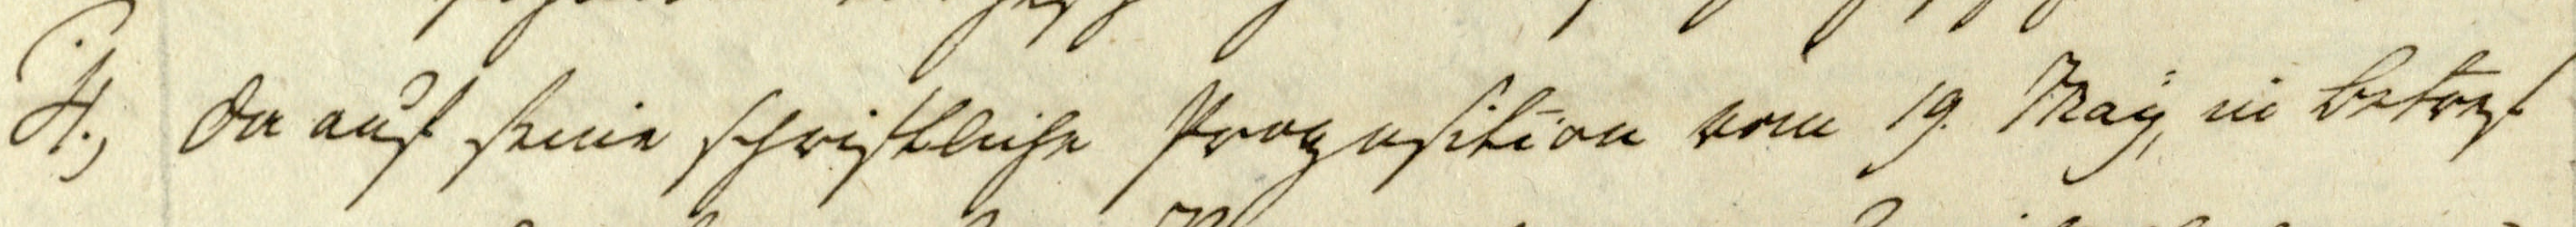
4., Da auf seine schriftliche Proposition vom 19. Maÿ, in betref
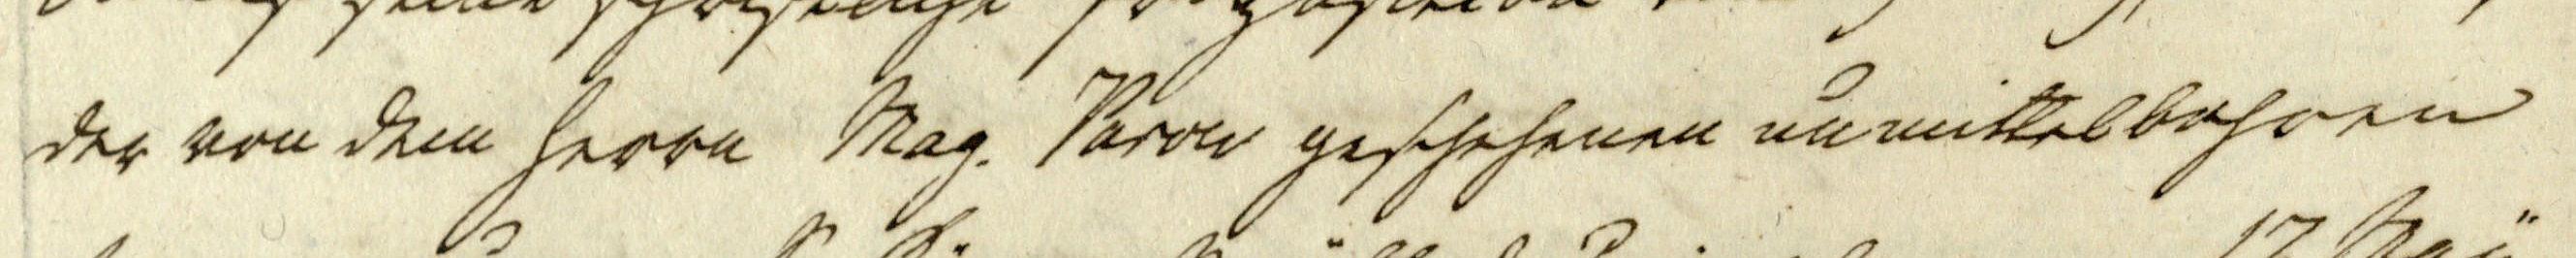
der von dem herrn Mag. Parow geschehenen unmittelbahren
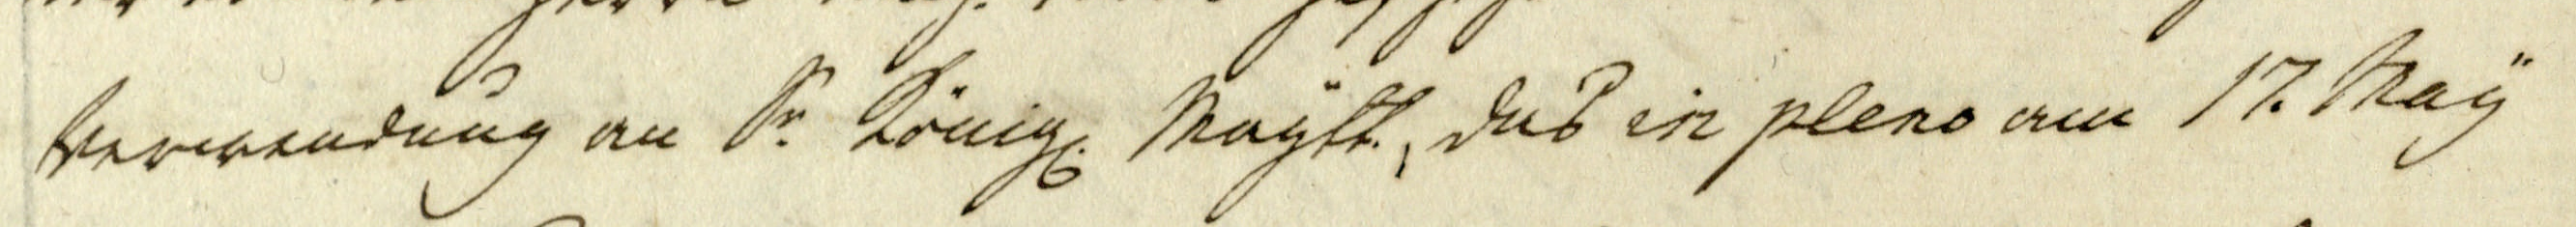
Verwendung an Sr. Königl. Maÿtt. das in pleno am 17. Maÿ
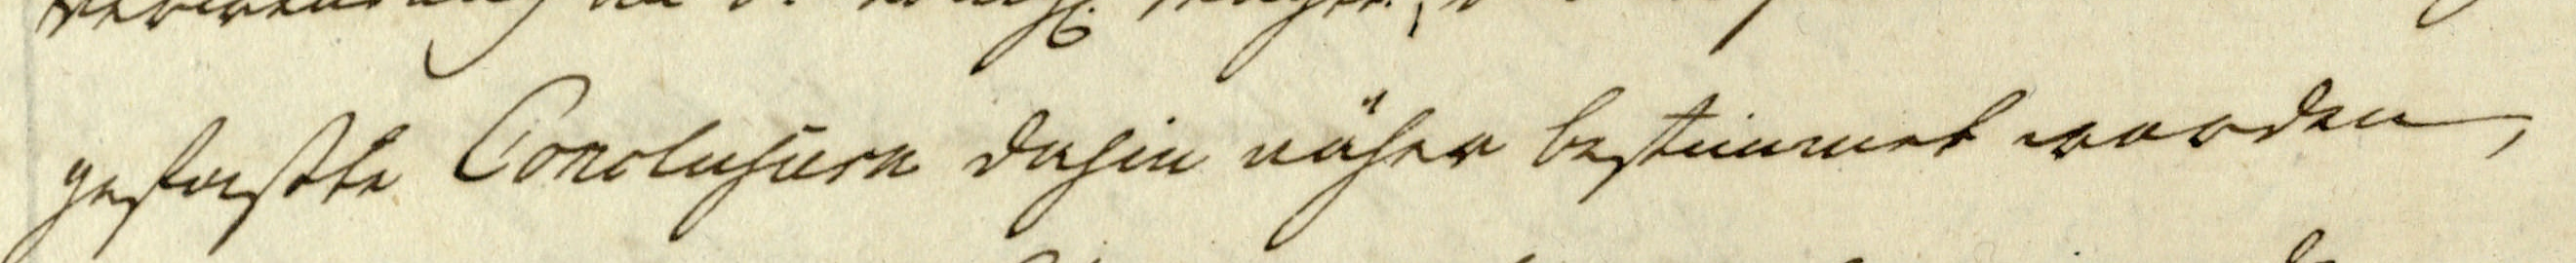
gefaßte Conclusm dahin näher bestimmet worden,
